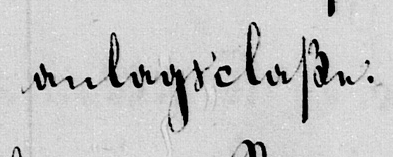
anlagsclaße:
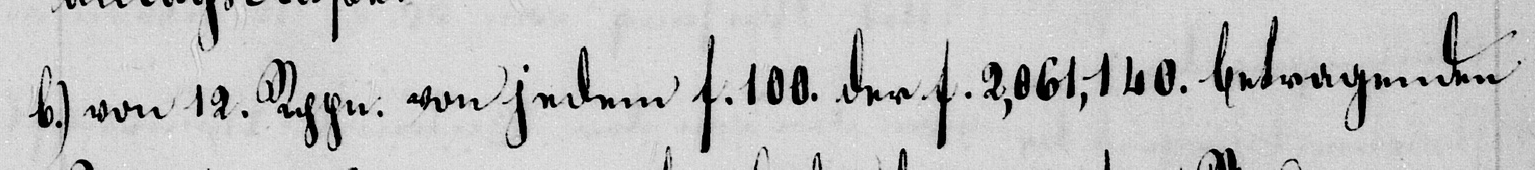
b.) von 12. Rppn. von jedem f. 100. der f. 2,061,140. betragenden
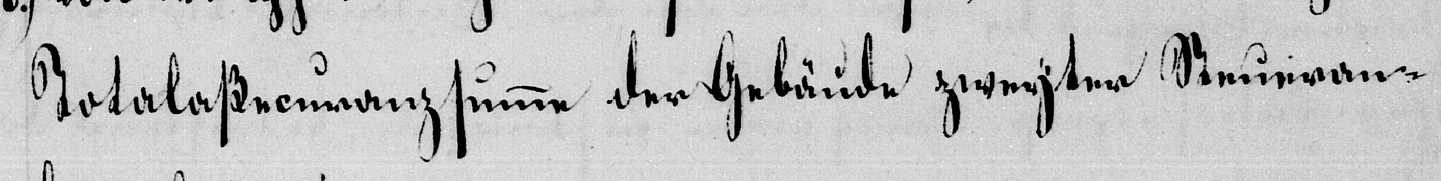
Totalaßecuranzsumme der Gebäude der zweyten Steueran¬
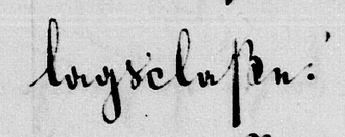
lagsclaße:
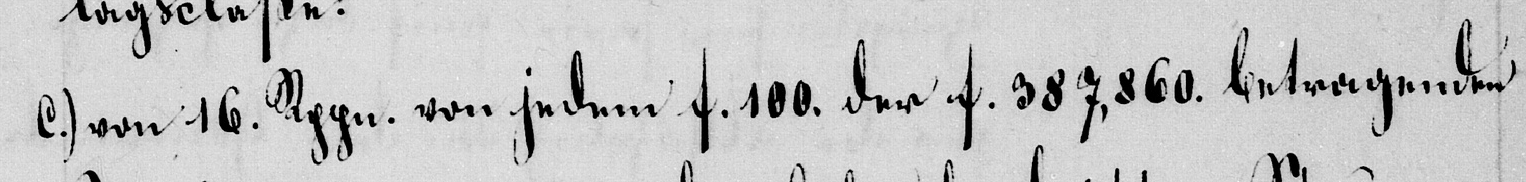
c.) von 16. Rppn. von jedem f. 100. der f. 387,860. betragenden
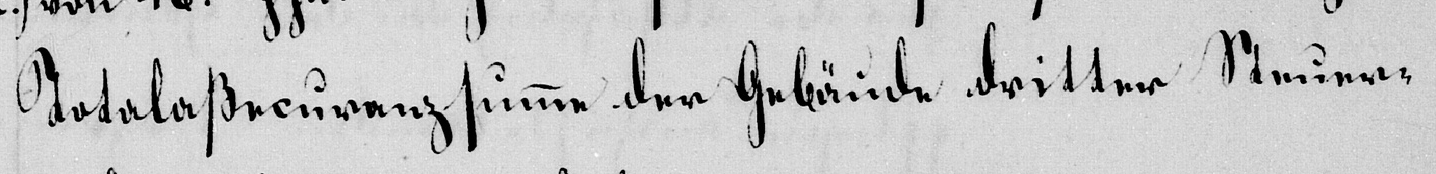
Totalaßecuranzsumme der Gebäude dritter Steuer¬
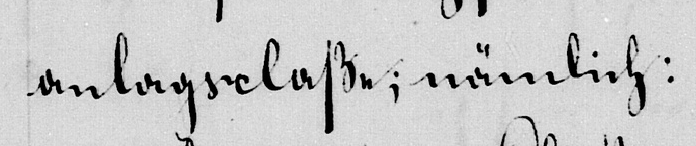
anlagsclaße; nämlich:
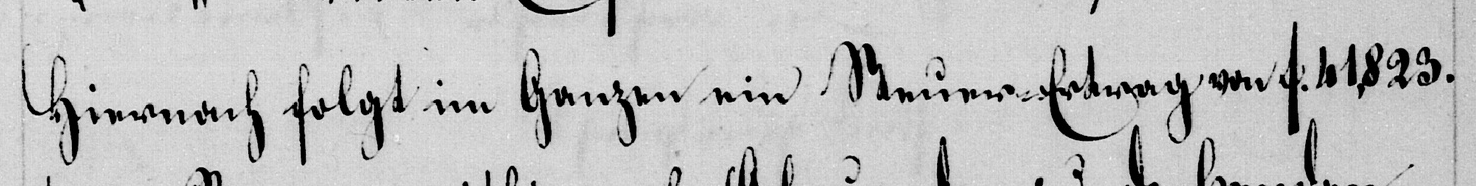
Hiernach folgt im Ganzen ein Steuer-Ertrag von f. 41,823.
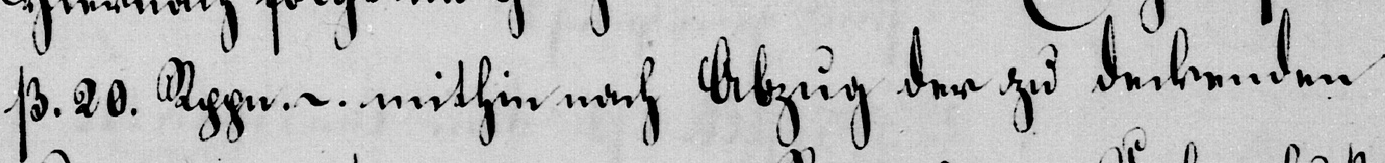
ß. 20. Rppn. –. mithin nach Abzug der zu deckenden
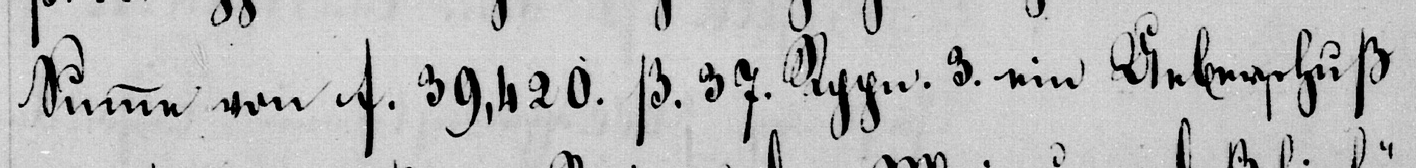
Summe von f. 39,420. ß. 37. Rppn. 3. ein Ueberschuß
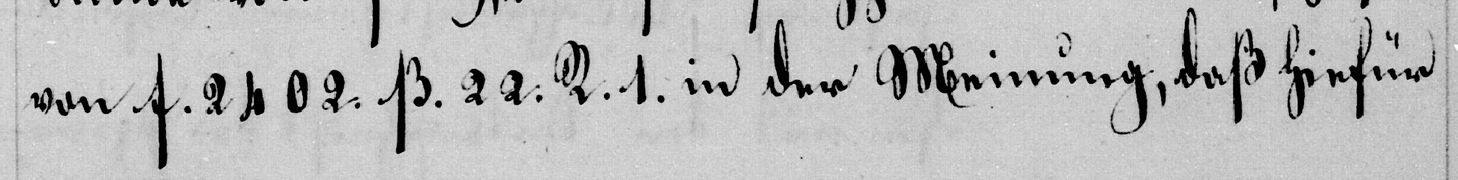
von f. 2402. ß. 22. R. 1. in der Meinung, daß hiefür
